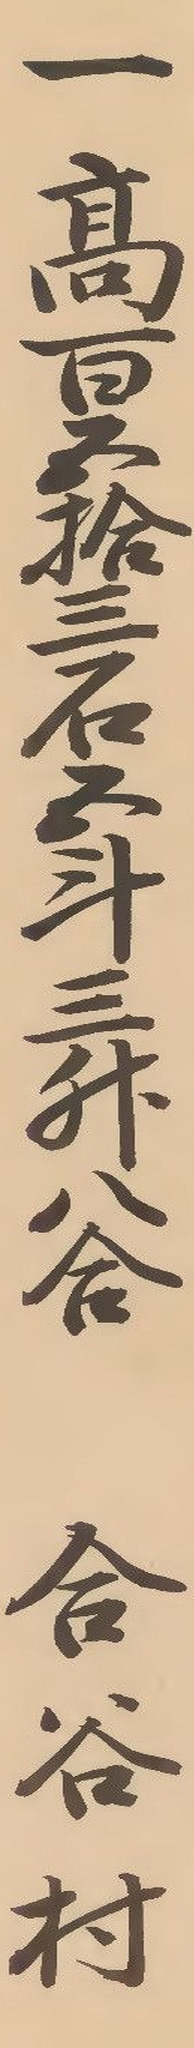一高百五拾三石五斗三升八合合谷村
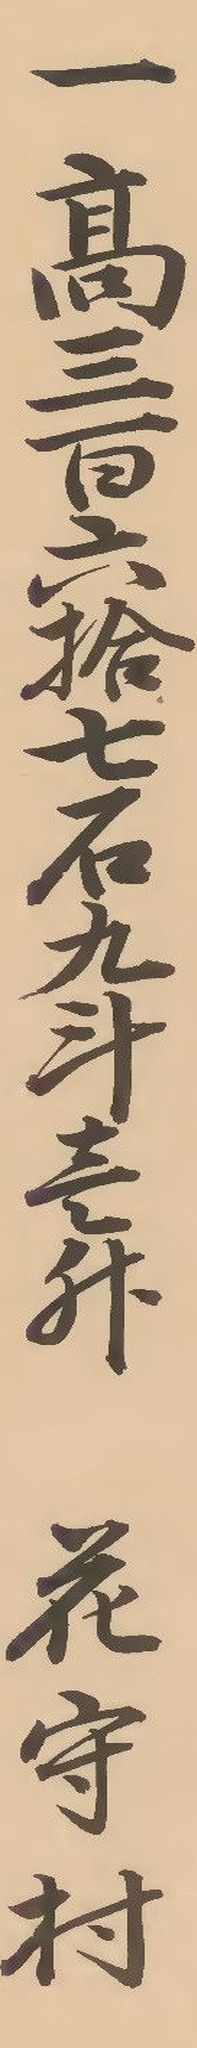一高三百六拾七石九斗壱升花守村

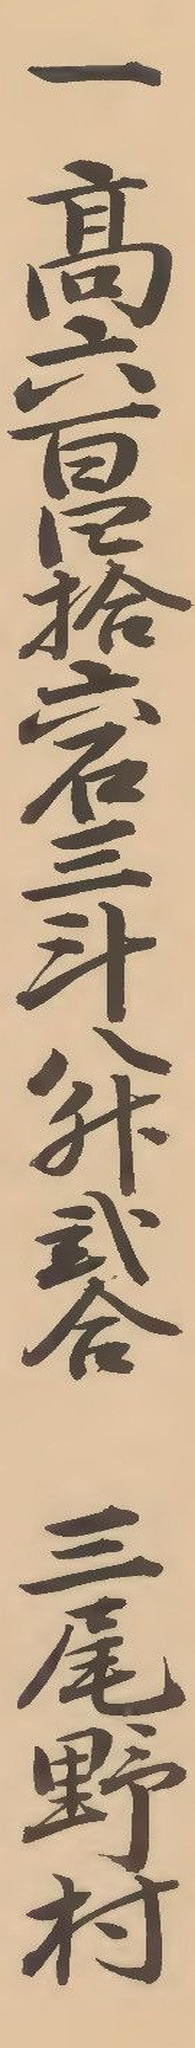一高六百四拾六石三斗八升弐合三尾野村
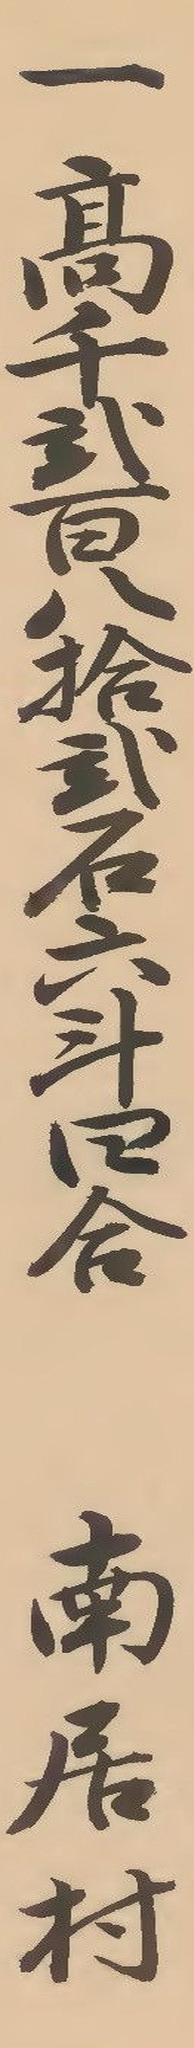一高千弐百八拾弐石六斗四合南居村
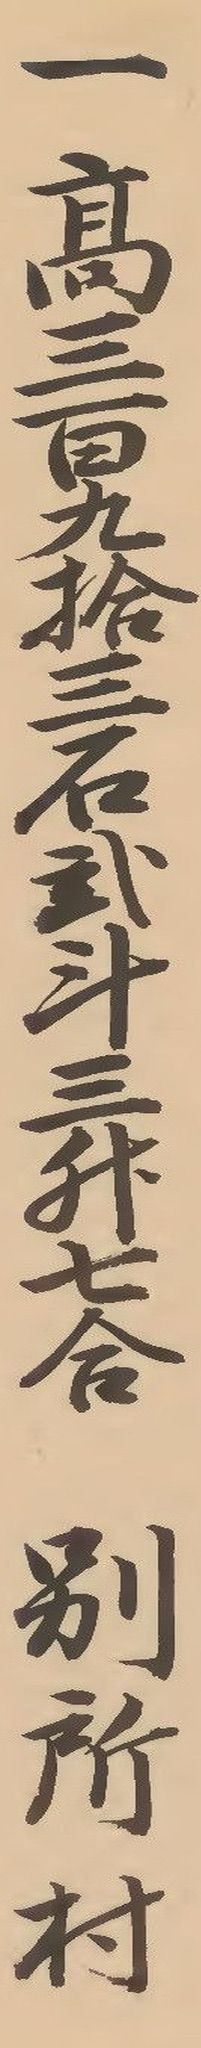一高三百九拾三石弐斗三升七合別所村
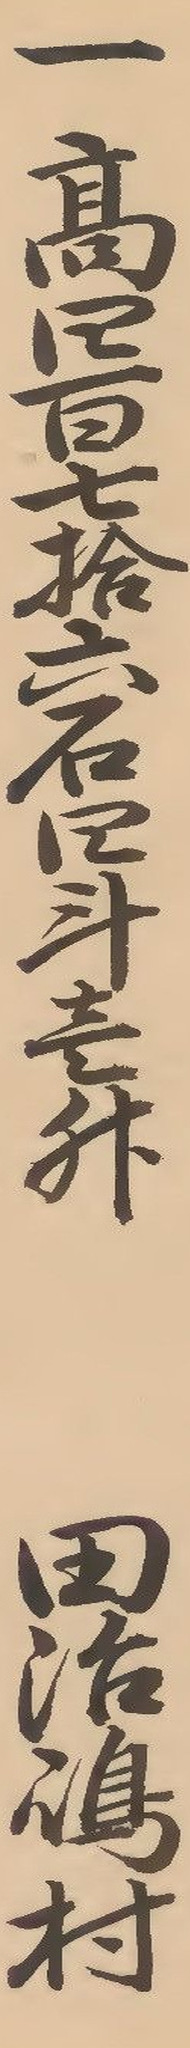一高四百七拾六石四斗壱升田治島村
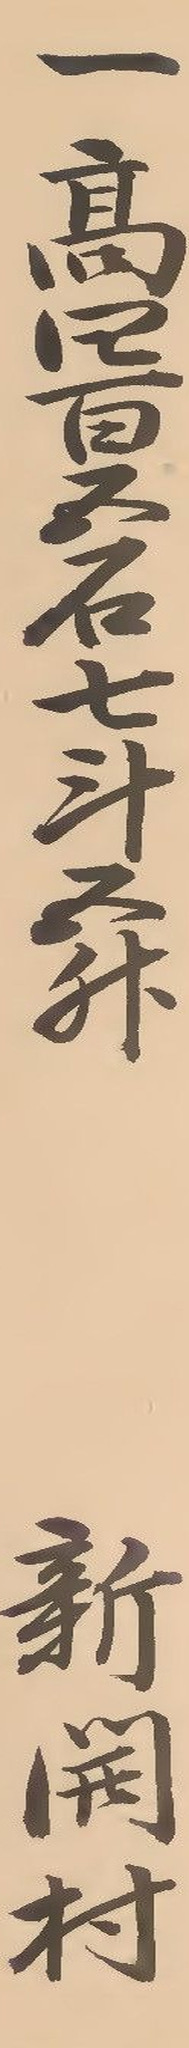一高四百五石七斗五升新開村
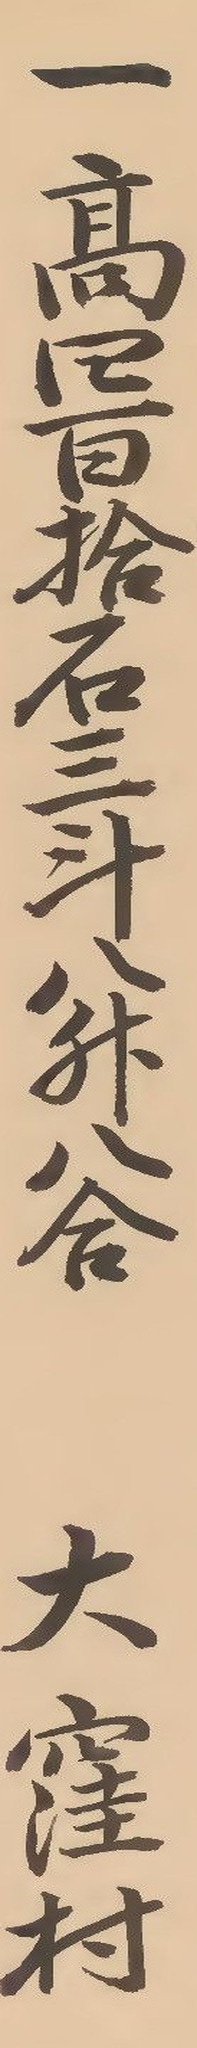一高四百拾石三斗八升八合大窪村
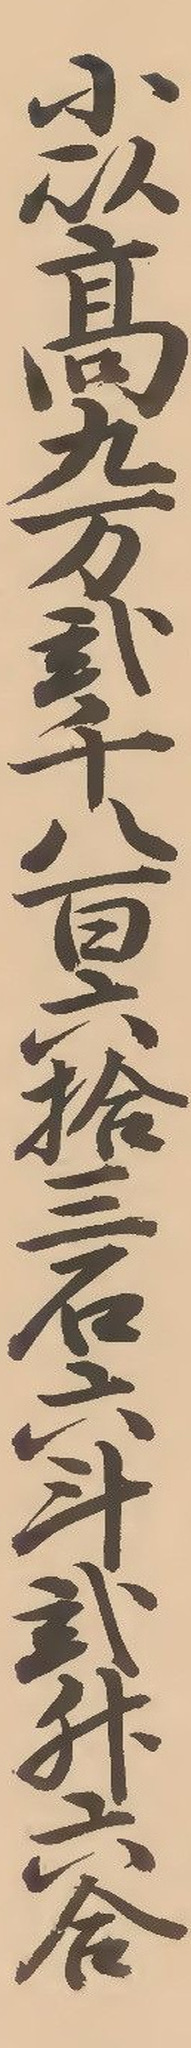小以高九万弐千八百六拾三石六斗弐升六合

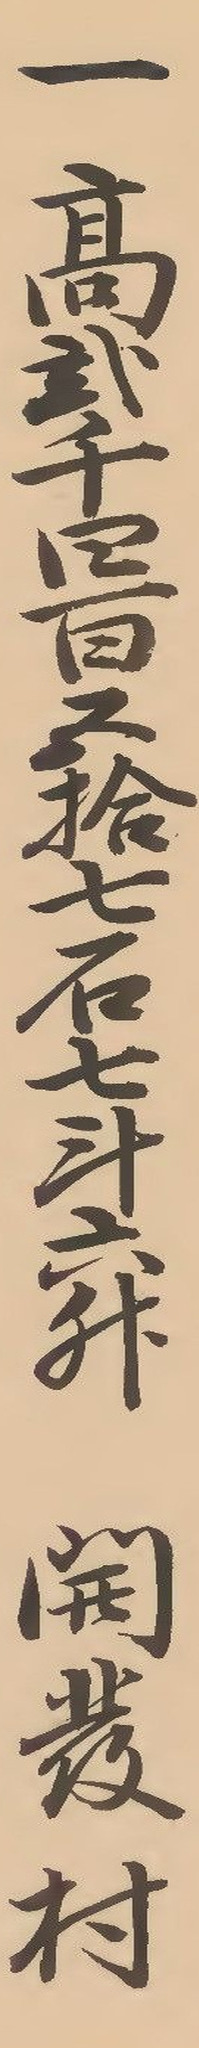一高弐千四百五拾七石七斗六升開発村
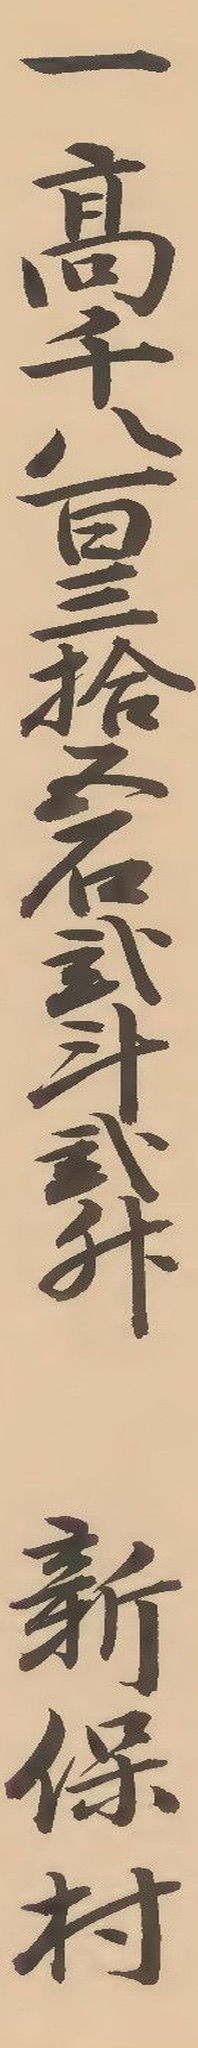一高千八百三拾五石弐斗弐升新保村
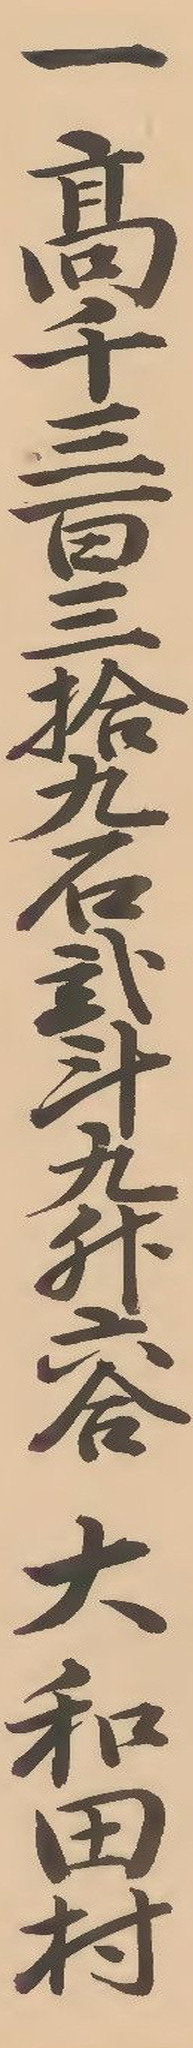一高千三百三拾九石弐斗九升六合大和田村
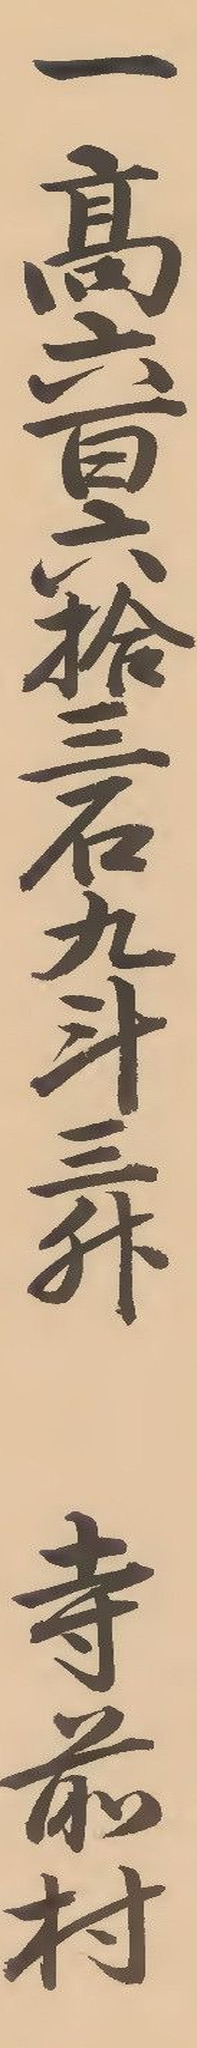一高六百六拾三石九斗三升寺前村

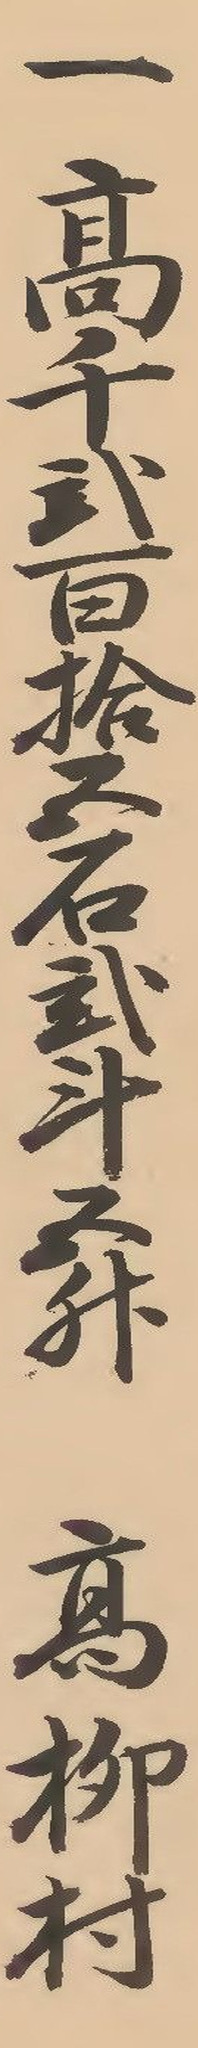一高千弐百拾五石弐斗五升高柳村
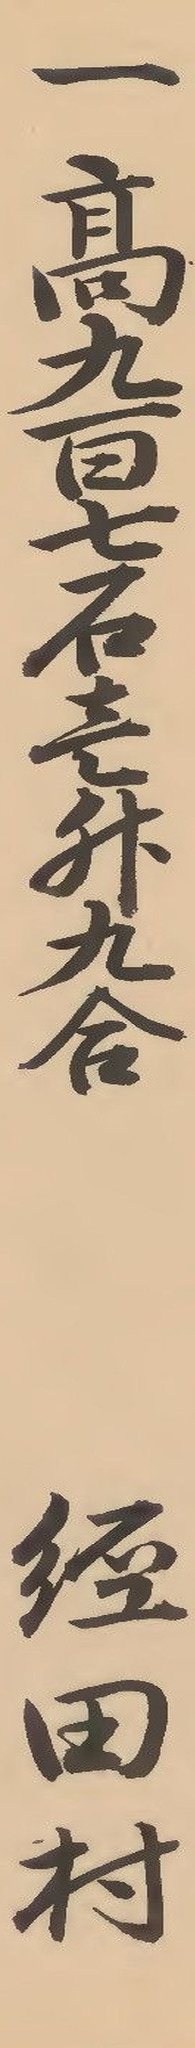一高九百七石壱升九合経田村
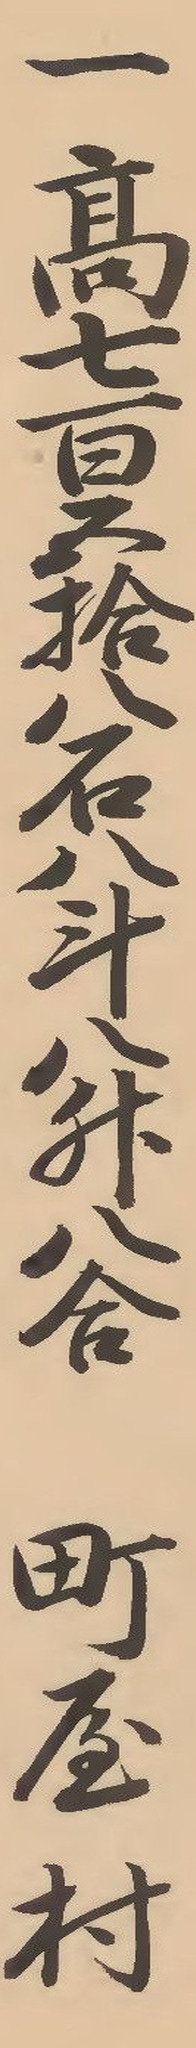一高七百五拾八石八斗八升八合町屋村
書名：越前国郷帳
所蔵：国立公文書館 National Archives of Japan
